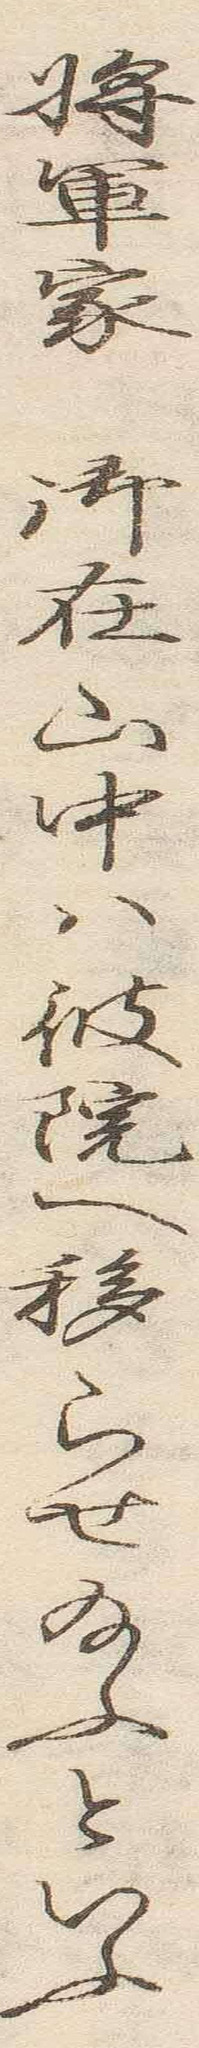将軍家御在山中は彼院へ移らせ給ふといふ
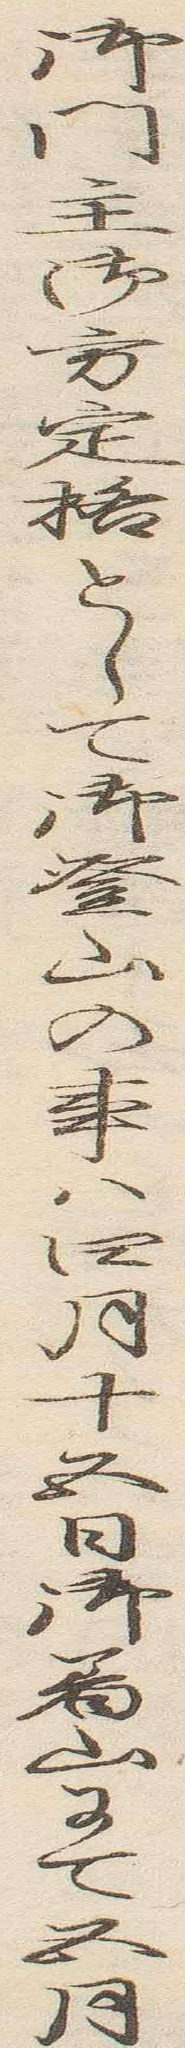御門主御方定格として御登山の事は四月十五日御着山にて五月
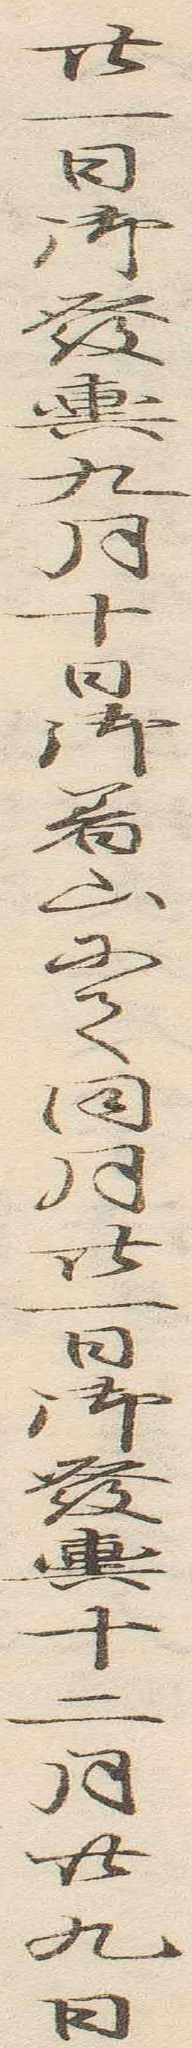廿一日御發輿九月十日御着山にて同月廿一日御發輿十二月廿九日
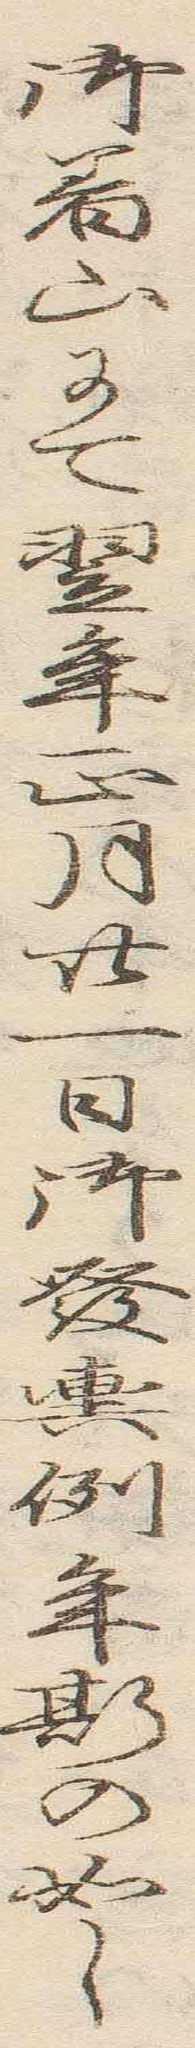御着山にて翌年正月廿一日御發輿例年斯の如し
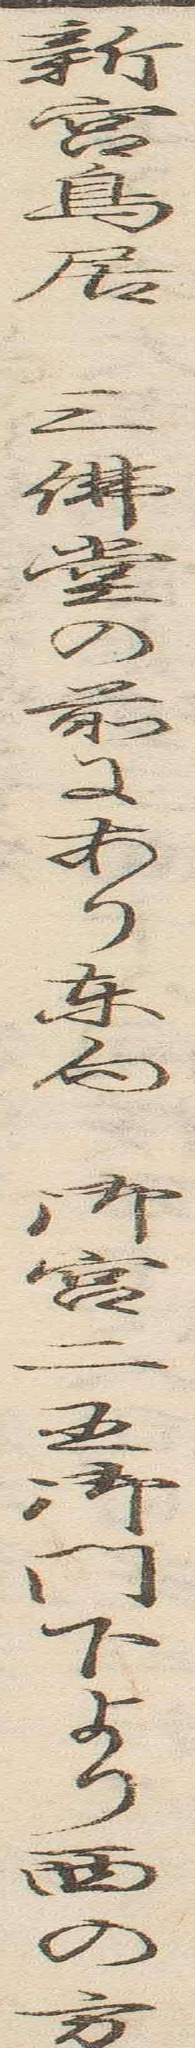新宮鳥居三佛堂の前にあり東向御宮二王御門下より西の方
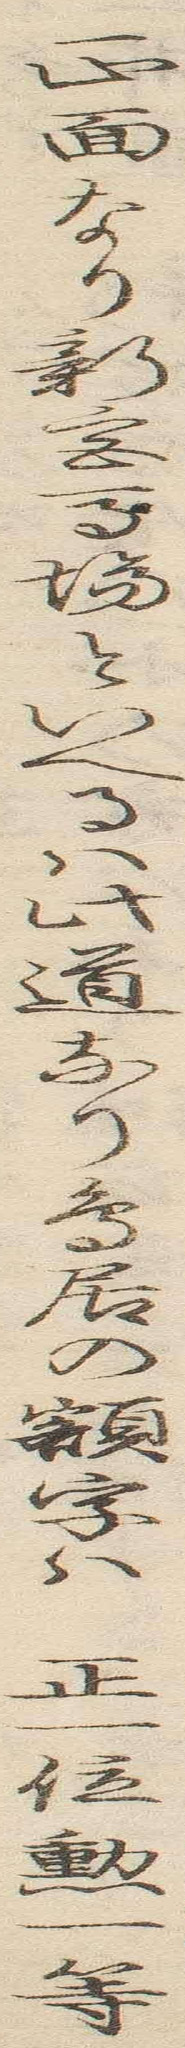正面なり新宮馬場といへるは此道なり鳥居の額字は正一位勲一等
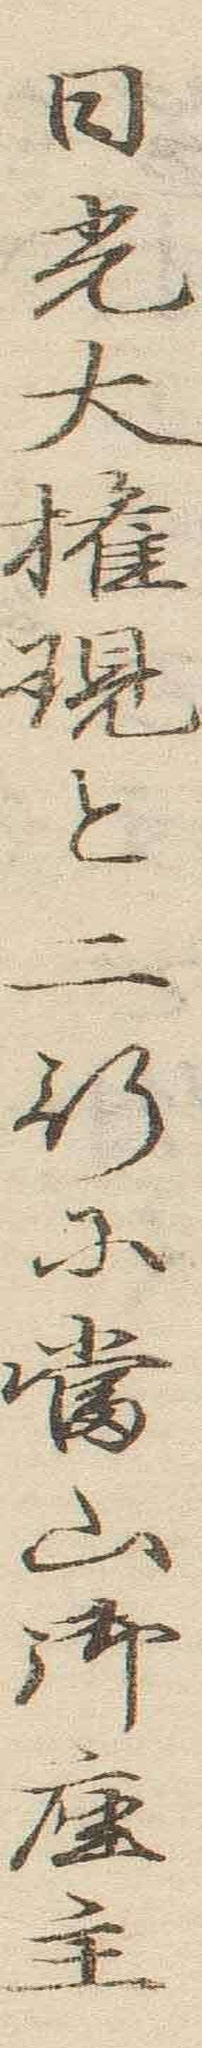日光大権現と二行に當山御座主
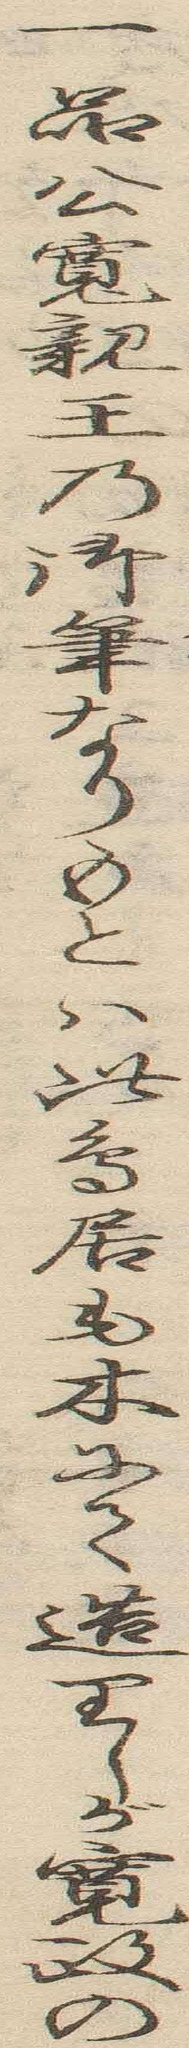一品公寬親王の御筆なりもとは此鳥居も木にて造りしが寛政の

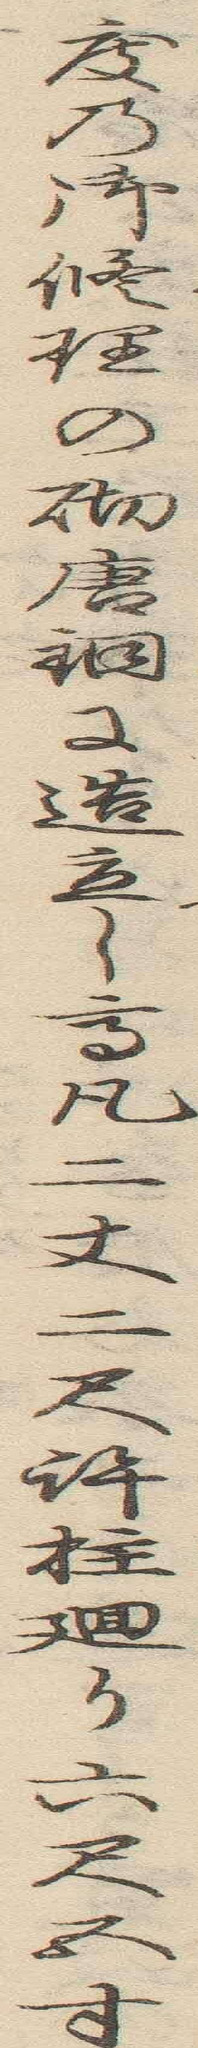度の御修理の砌唐銅に造立し高凡二丈二尺許柱廽り六尺五寸
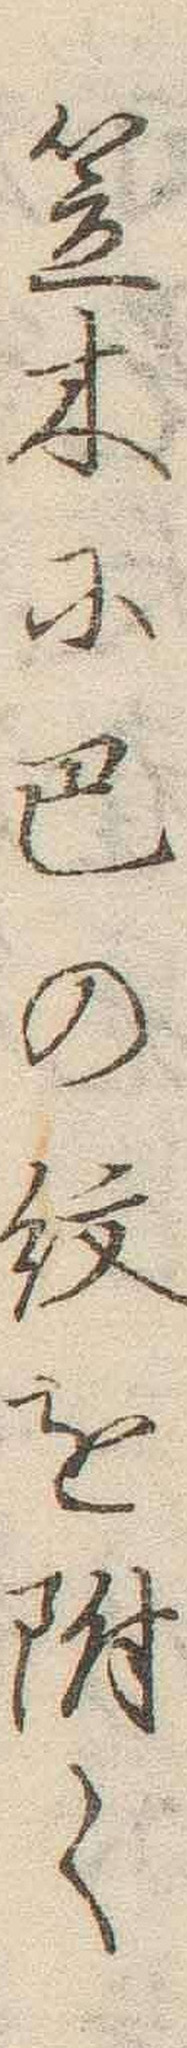笠木に巴の紋を附く
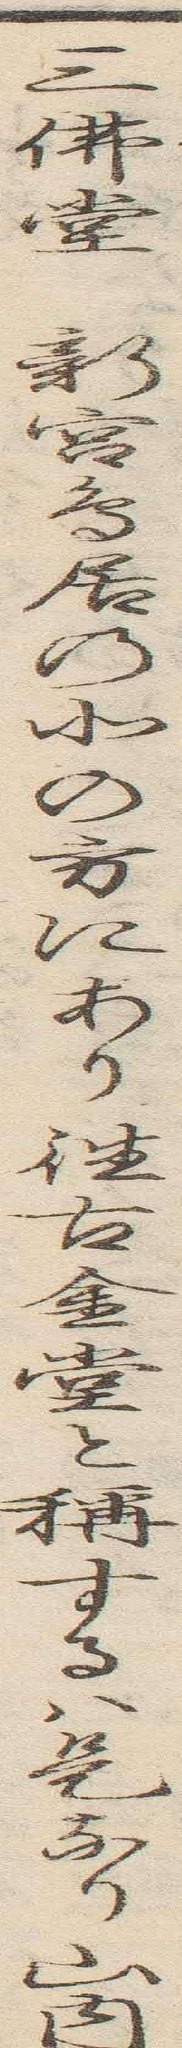三佛堂新宮鳥居の北の方にあり徃古金堂と稱するは是なり山内
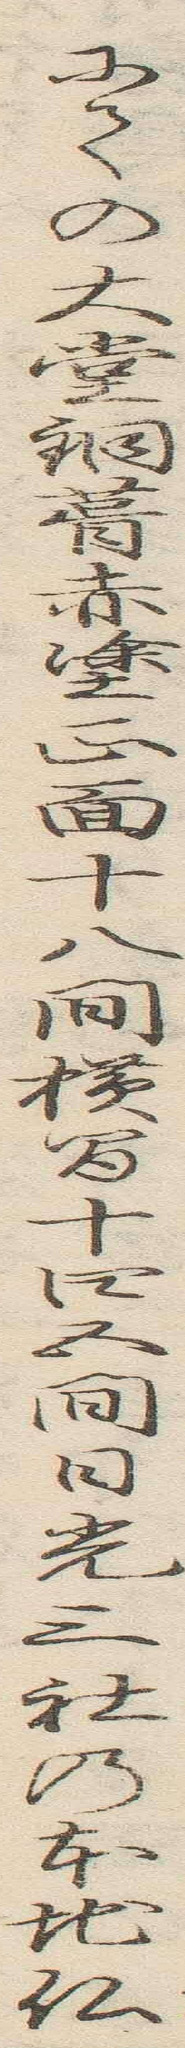にての大堂銅葺赤塗正面十八間横間十四五間日光三社の本地仏
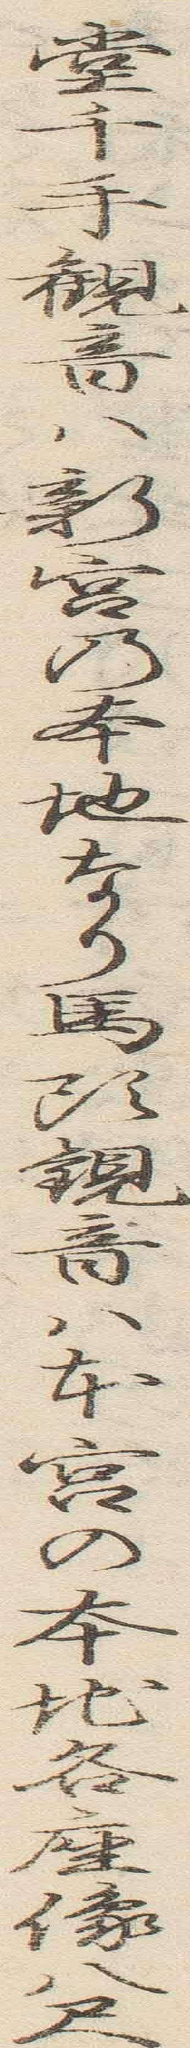堂千手観音は新宮の本地なり馬頭観音は本宮の本地各座像八尺
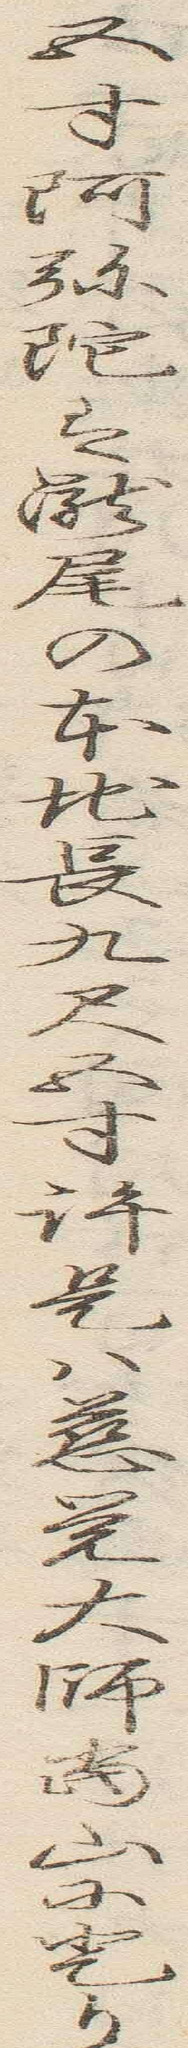五寸阿弥陀は瀧尾の本地長九尺五寸許是は慈覚大師當山に登り
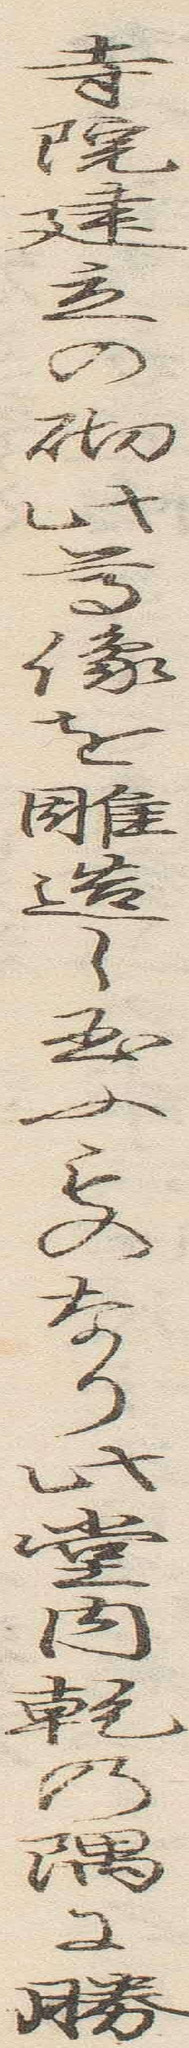寺院建立の砌此尊像を雕造し玉ふものなり此堂内乾の隅に勝
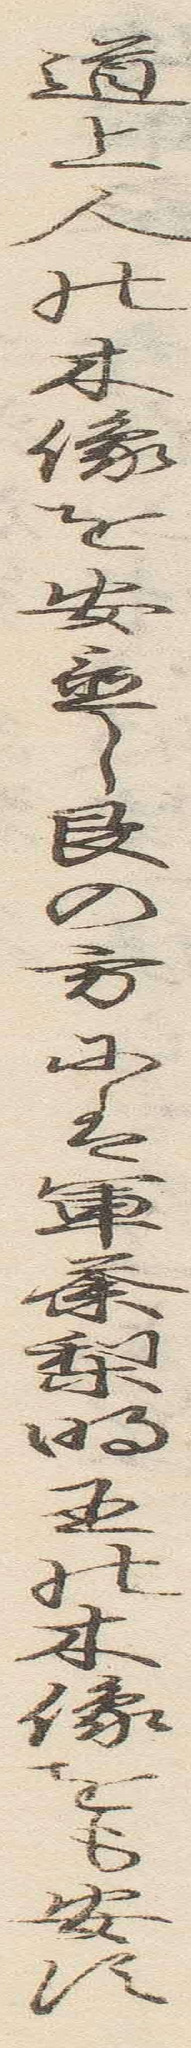道上人の木像を安置し艮の方には軍荼梨明王の木像をも安す
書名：日光山志
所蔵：東京学芸大学附属図書館 国文学研究資料館
